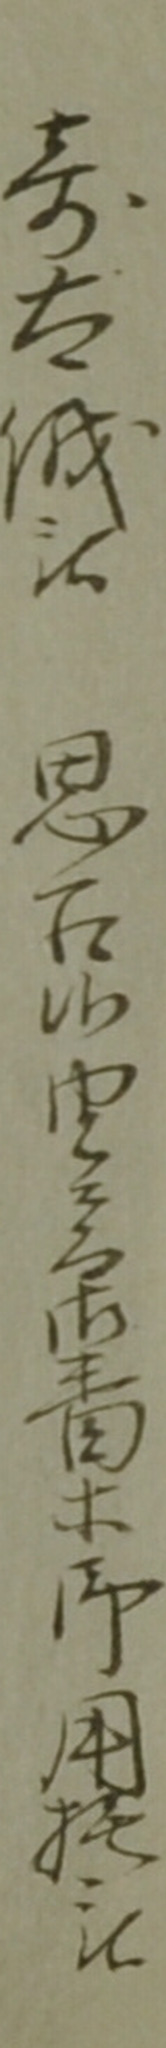寄太俄被思召候由ニ而御番等御用捨被
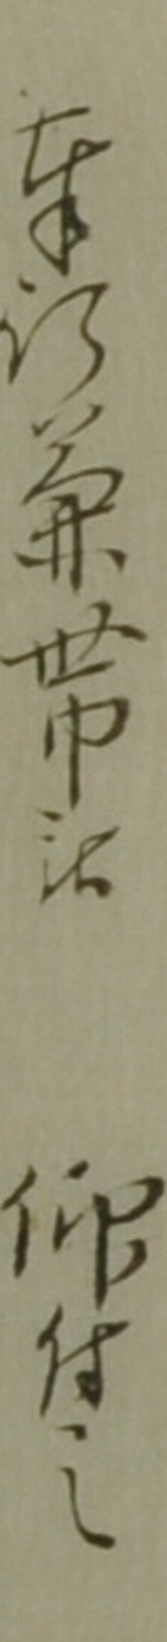奉行兼帯被仰付之
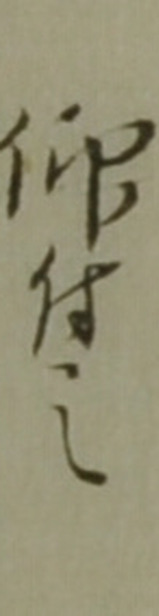仰付之
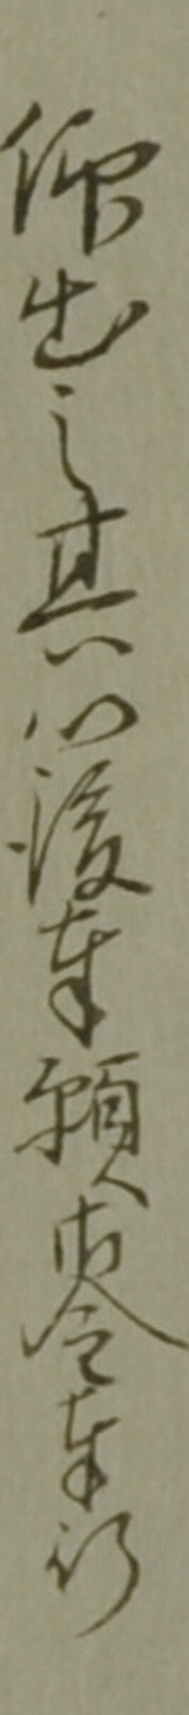仰出之其以後奉願御金奉行
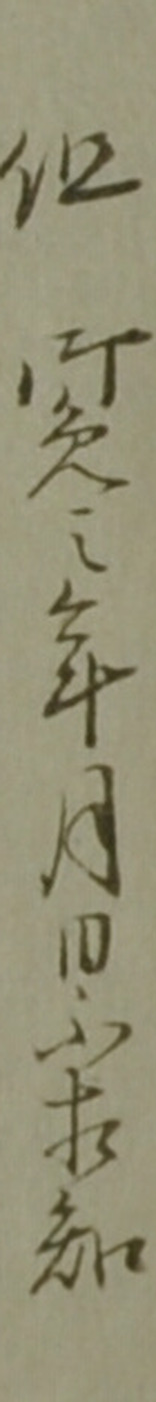但御免之年月日不相知
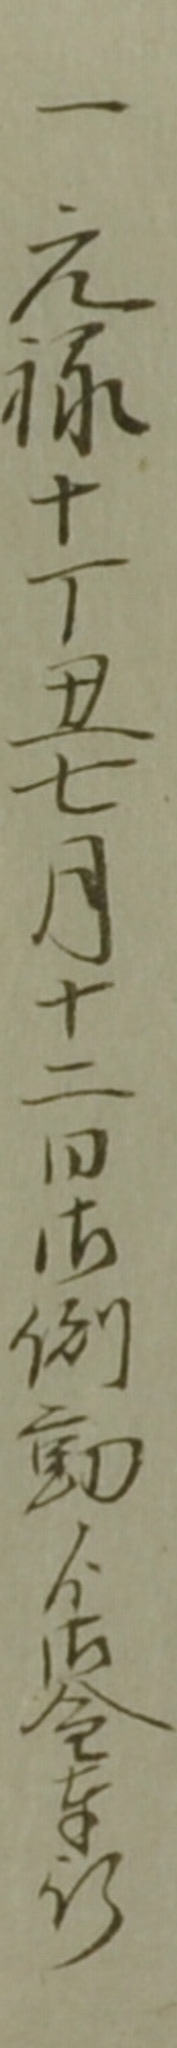一元禄十丁丑七月十二日御側勤ゟ御金奉行
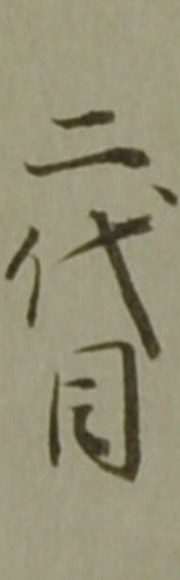二代目
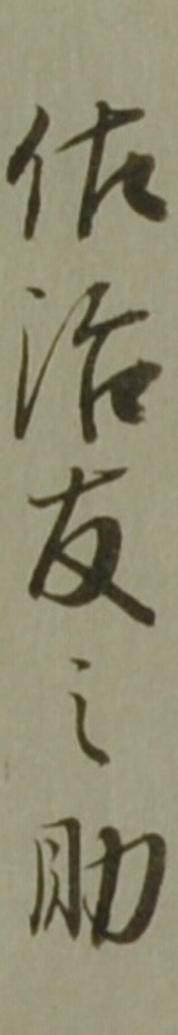佐治友之助
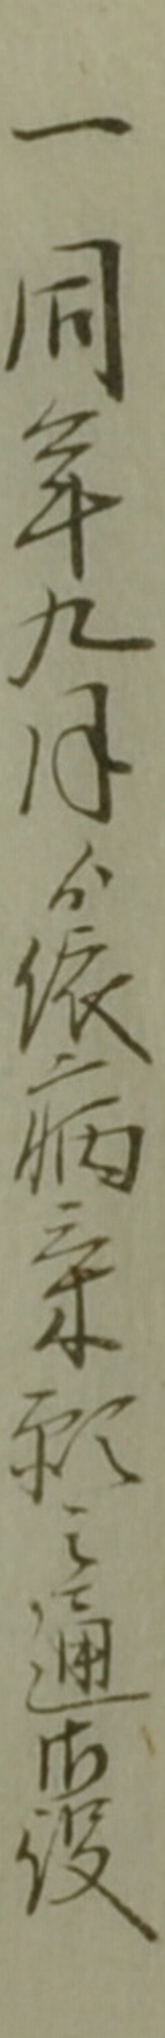一同年九月ゟ依病気願之通御役
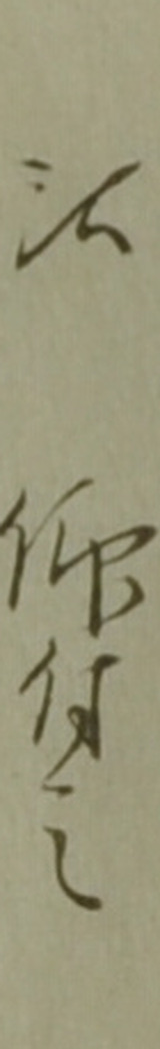被仰付之
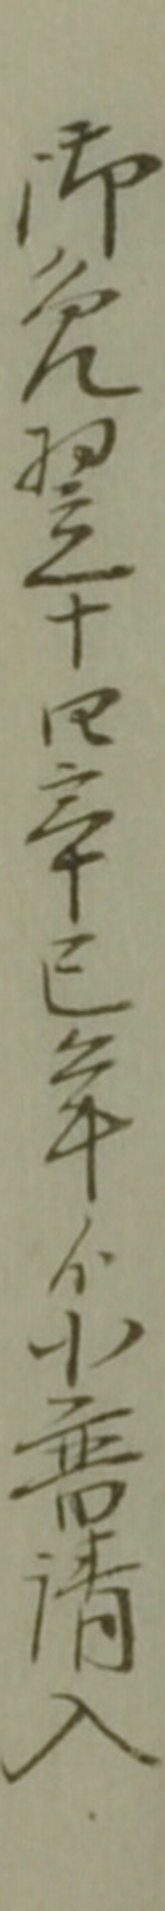御免翌十四辛巳年ゟ小普請入
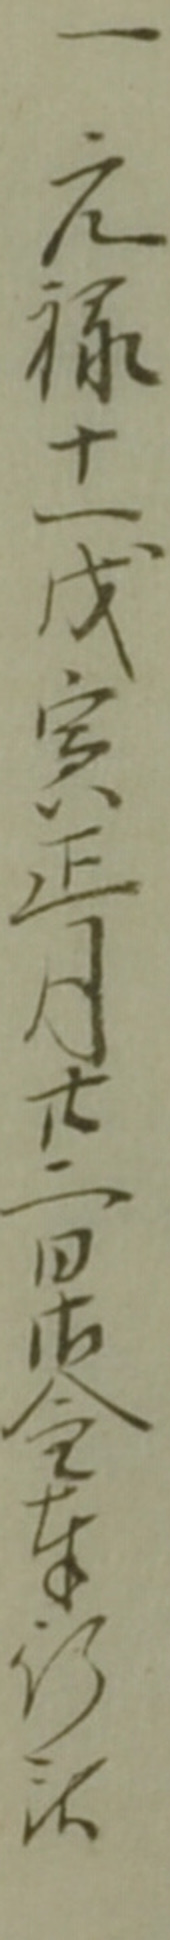一元禄十一戊寅正月廿二日御金奉行被
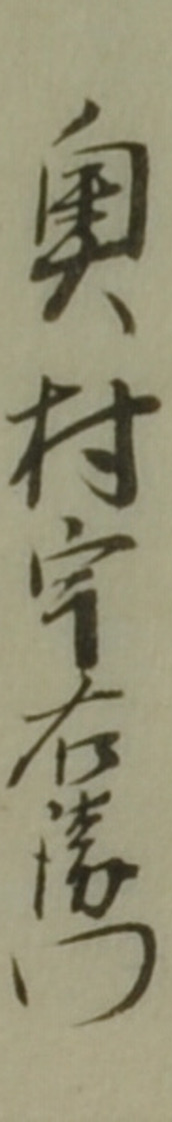奥村宇右衛門
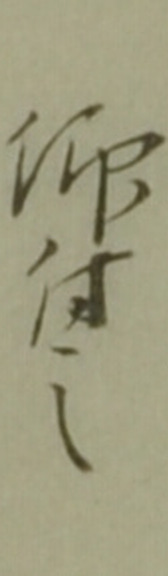仰付之
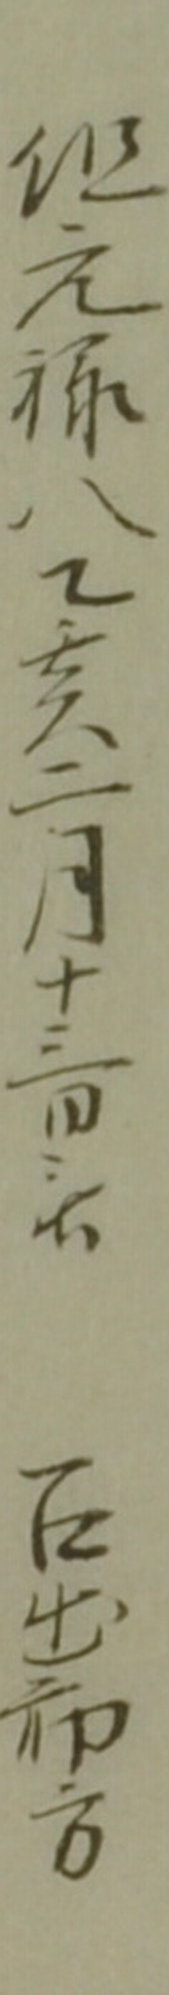但元禄八乙亥二月十三日被召出勤方
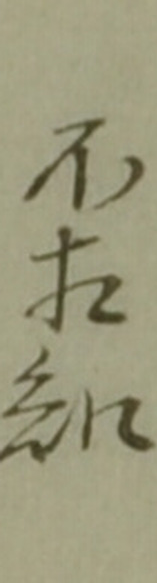不相知
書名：諸御役代々録（七）
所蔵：伊那市立高遠町図書館・合同会社AMANE
